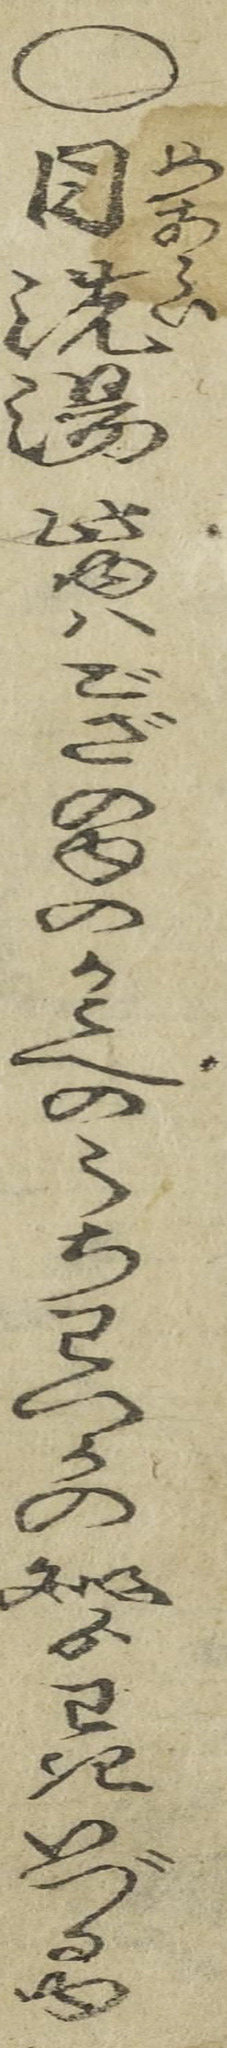〇目洗場此ゆはござのゆのかこへのうちわつかの処ゟわきいぢるゆ
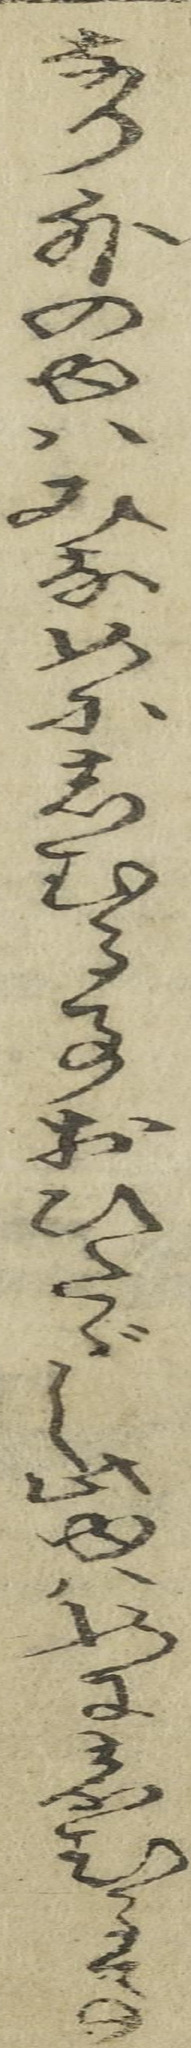なり外のゆはみなめにしむる事おひたゞし此ゆはめにしむる事
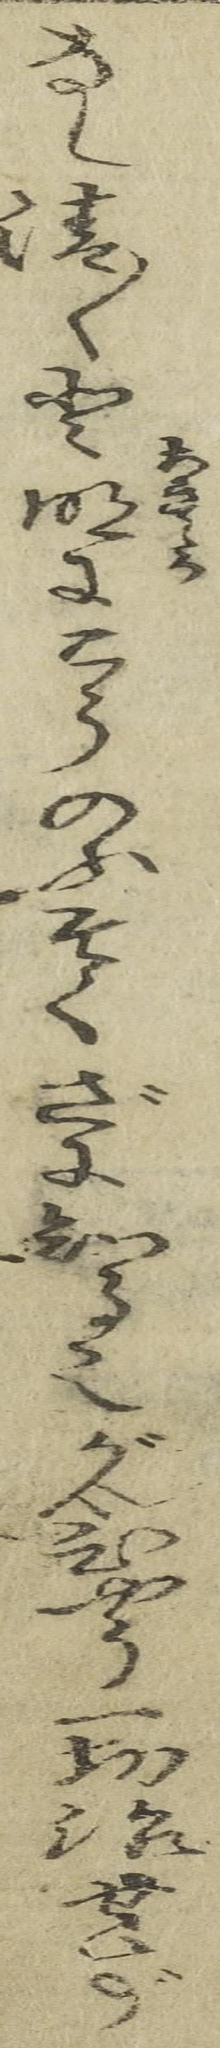なし清〳〵と明にこうのふそくざに知る也がんひやう一切治せず
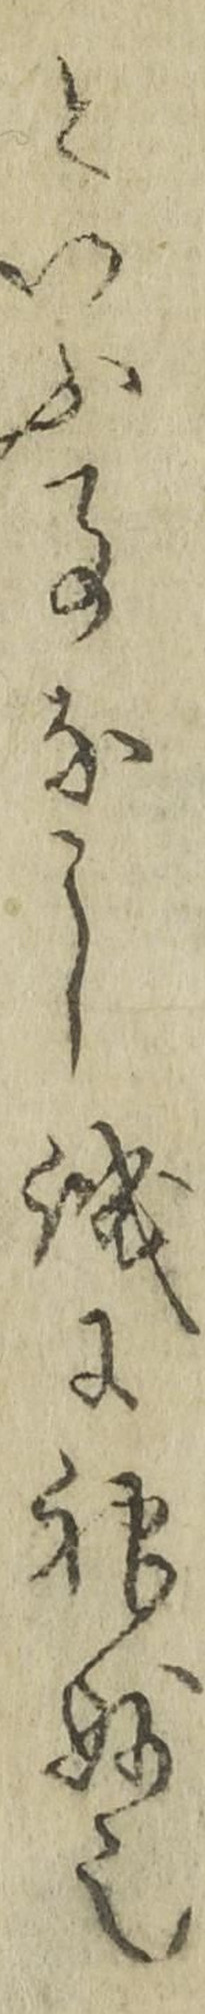といふ事なし誠に神妙也
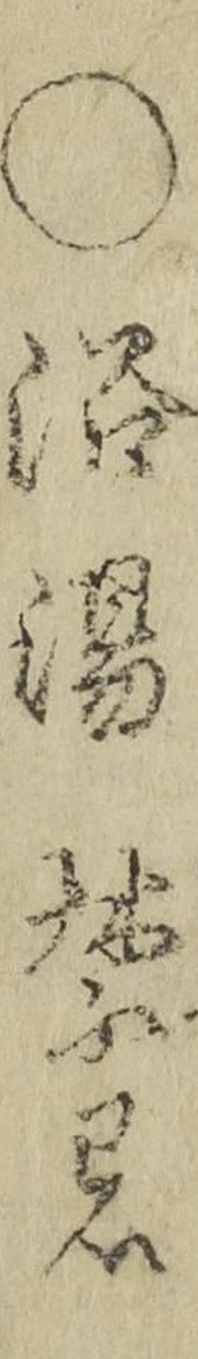〇治湯禁忌
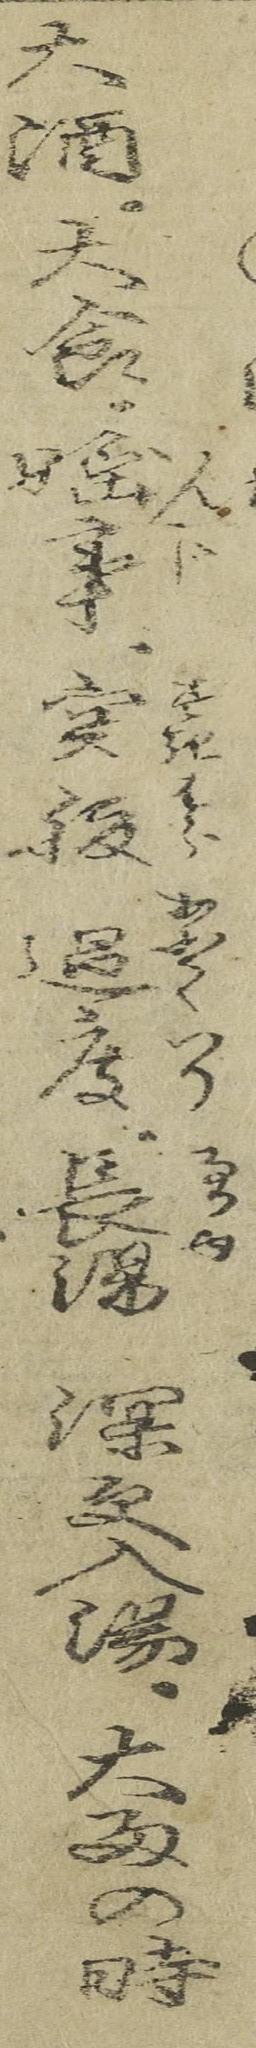大酒。大食。淫事。空腹。過度。長湯深更入湯。大雨の時
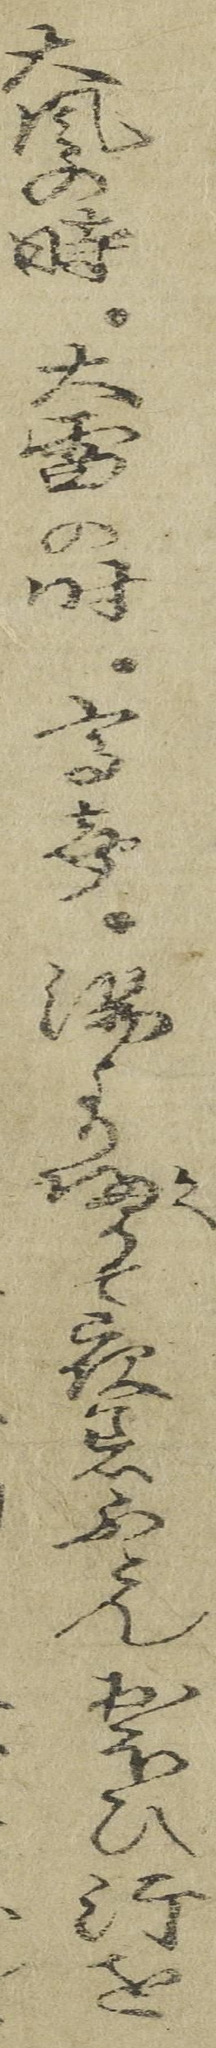大風の時。大雷の時。高声。湯より帰りて夜具ふとんおほひ行を
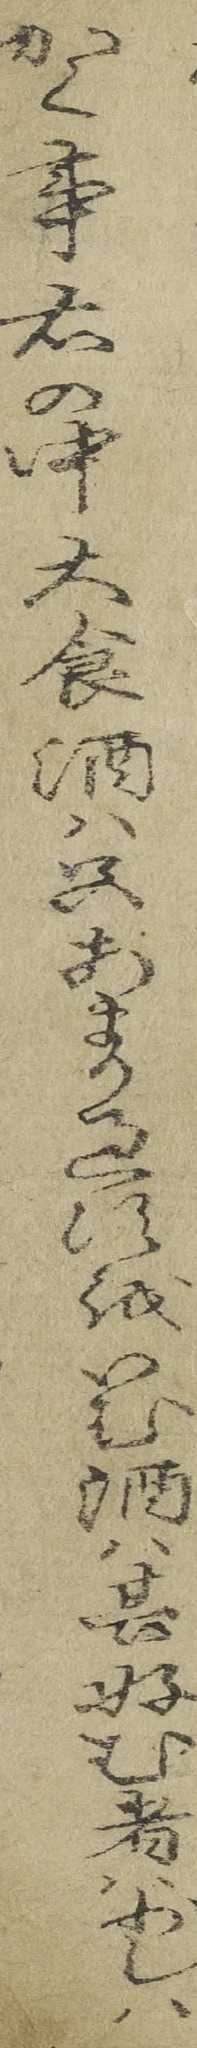かく事右の中大食酒は只あまり過すをいむ酒は甚好む者は少しは
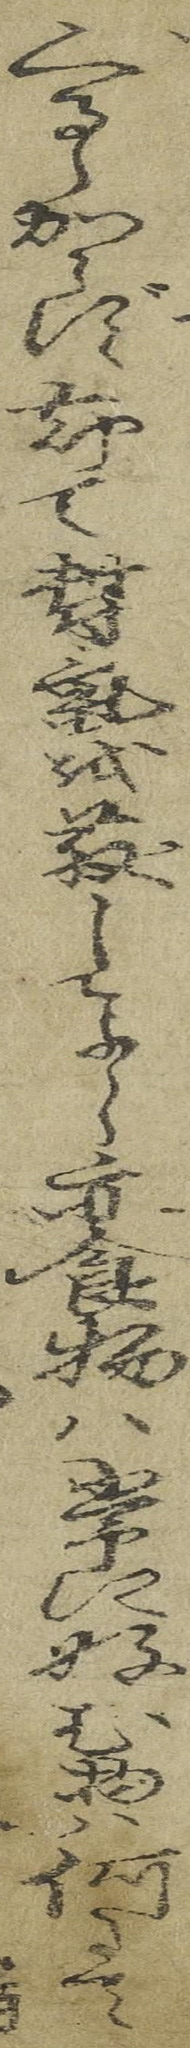くるしからず却て欝気を散してよし亦食物は常に好む物は何にて
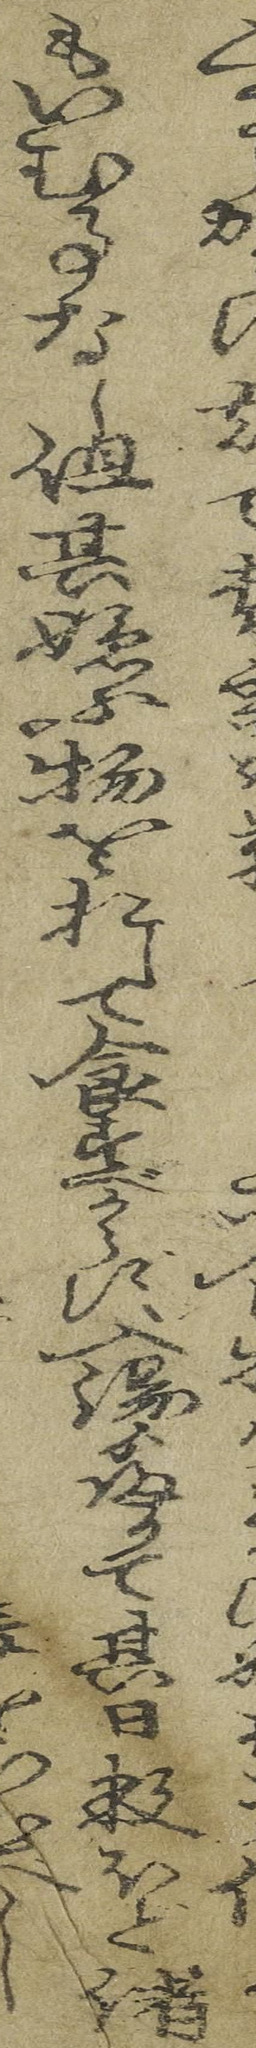もいむ事なし但其給ふ物をおして食すべからず入湯ゟ帰りて其日数ほと諸
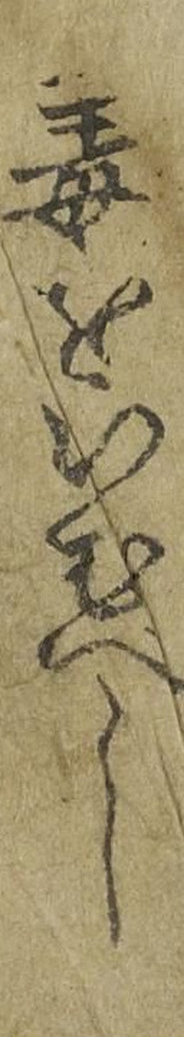毒をいむべし
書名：草津温泉　入湯案内記
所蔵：東京大学地震研究所図書室 Earthquake Research Institute Library, The University of Tokyo, JAPAN
